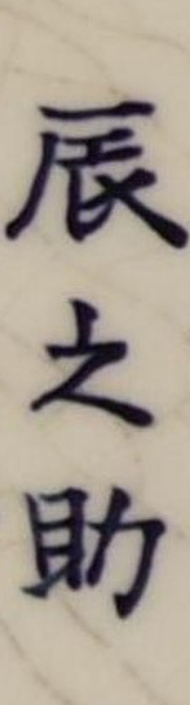辰之助
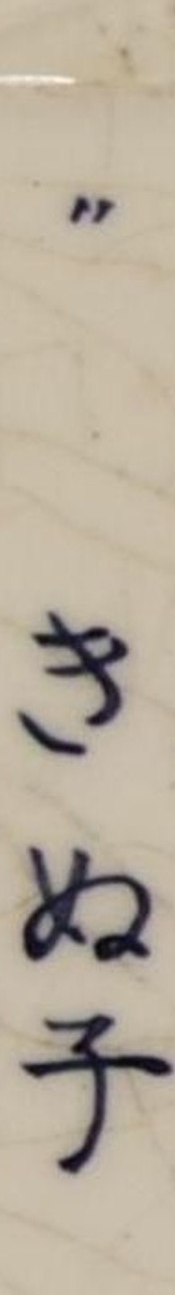きぬ子
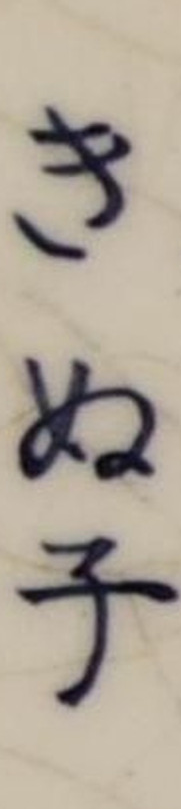きぬ子

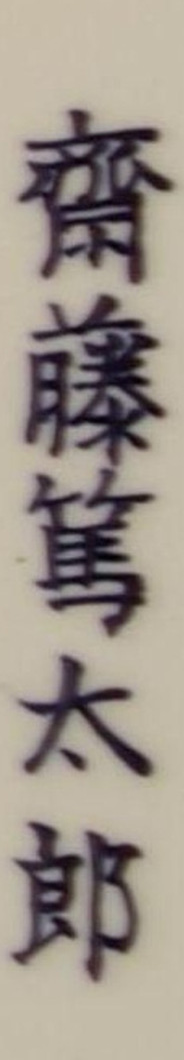斉藤篤太郎
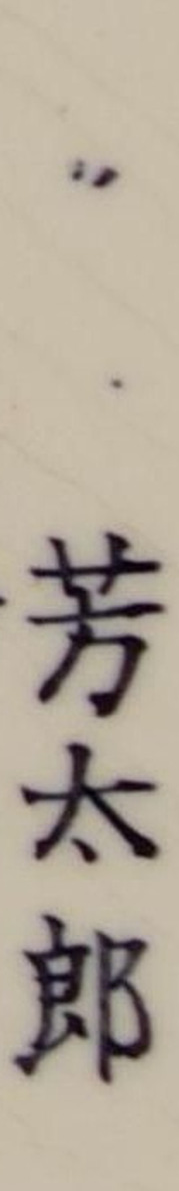芳太郎
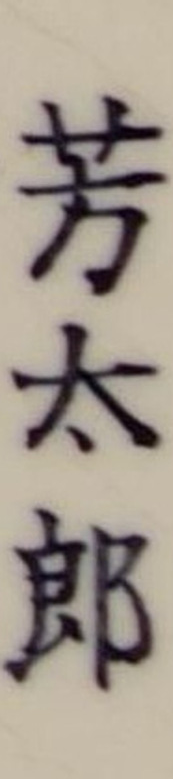芳太郎
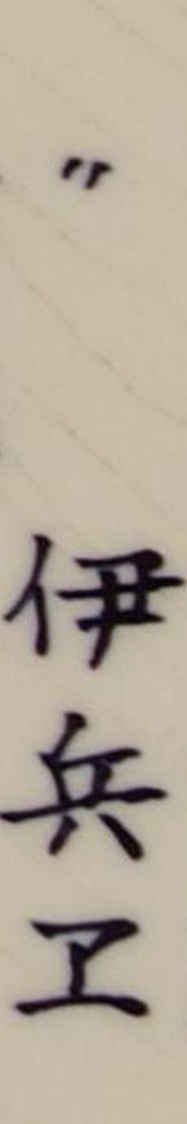伊兵エ
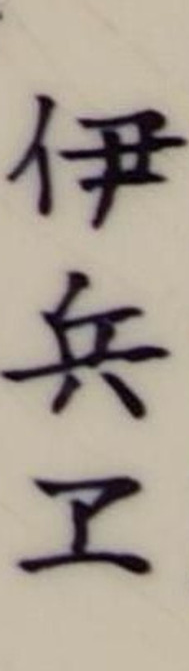伊兵エ
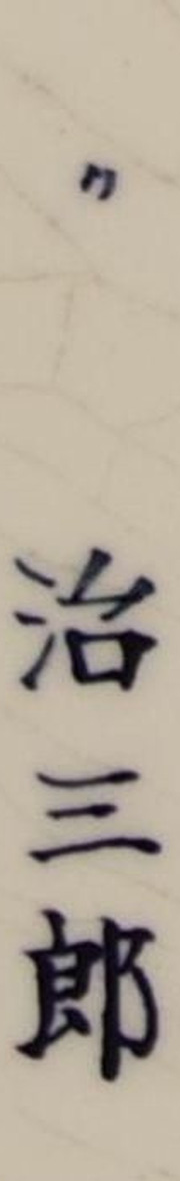治三郎
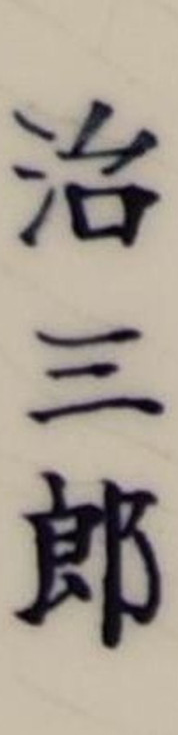治三郎
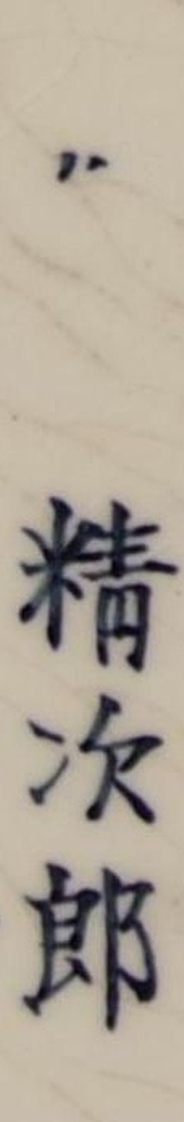精次郎
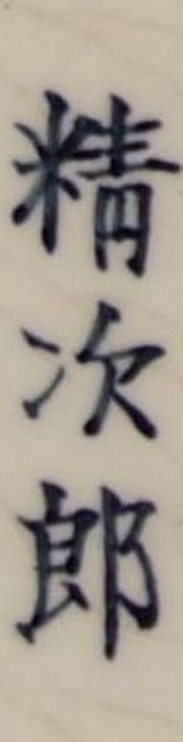精次郎
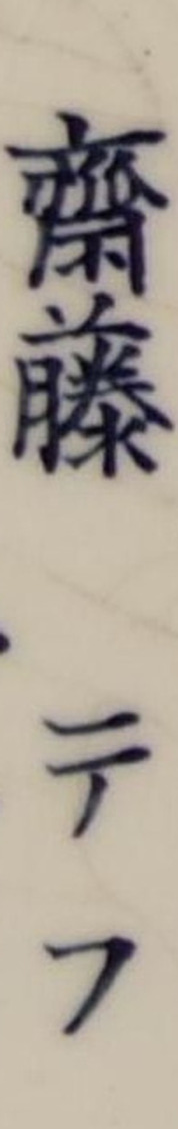斎藤テフ
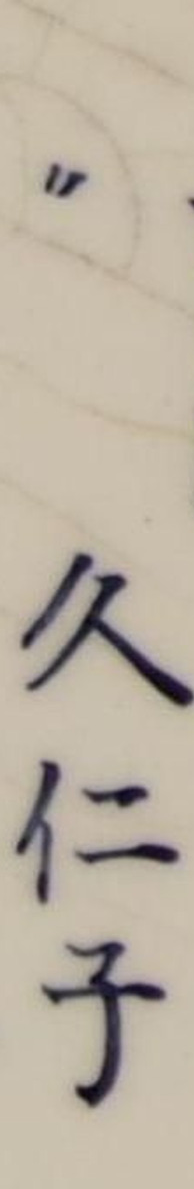久仁子
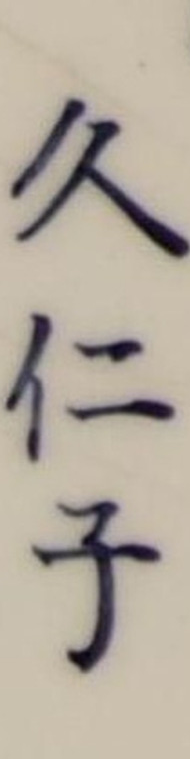久仁子

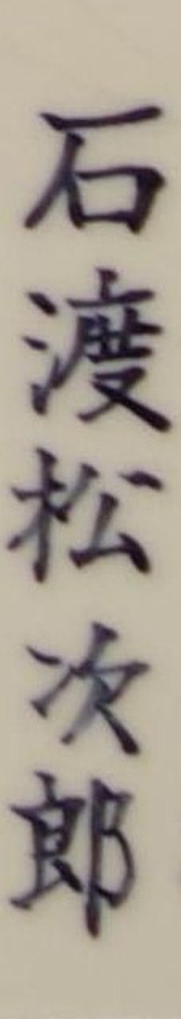石渡松次郎
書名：E~L
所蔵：高野山金剛峯寺
